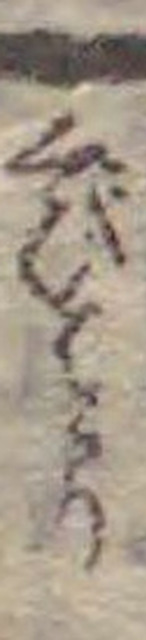くびはかり

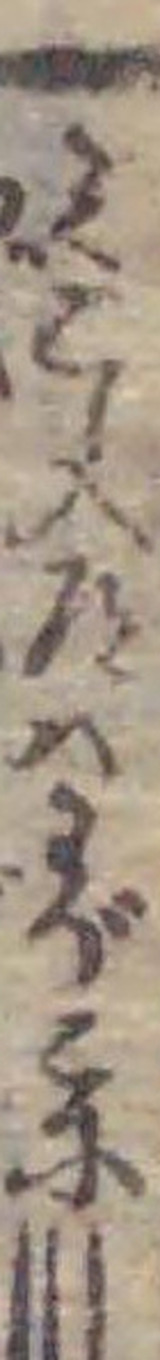みこし入道はわがこに
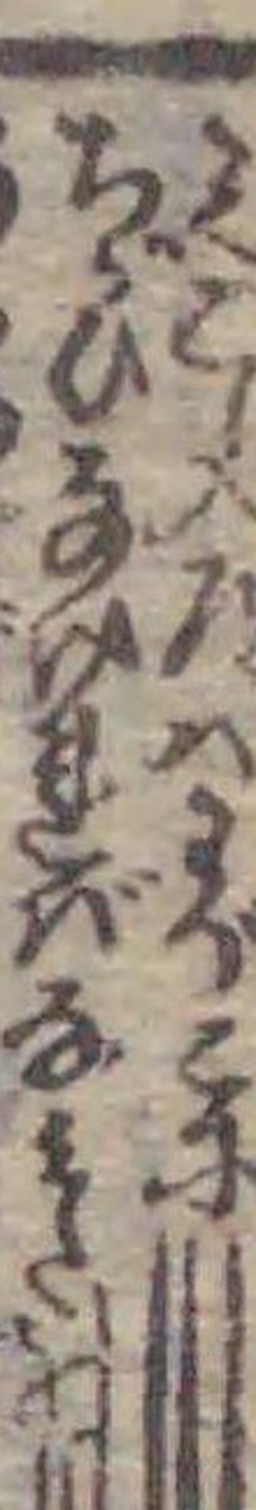ちがひなければなみたを
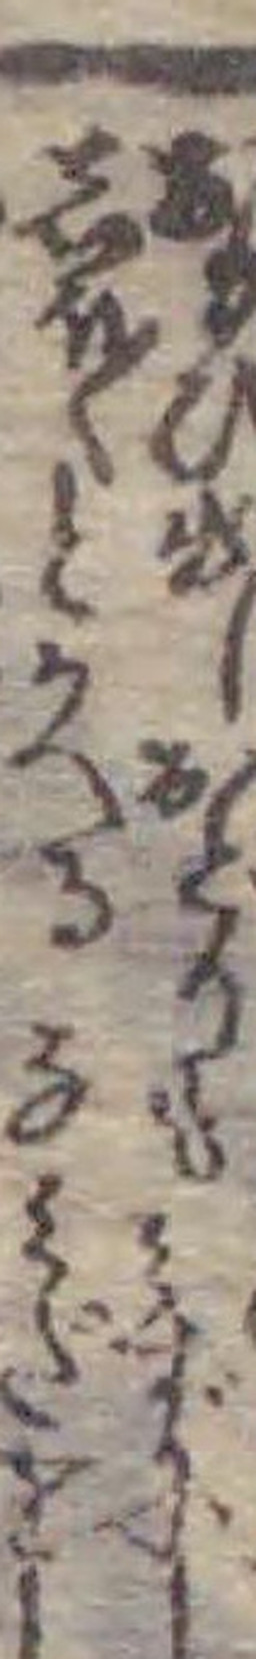しほ〳〵とかへるなみだを
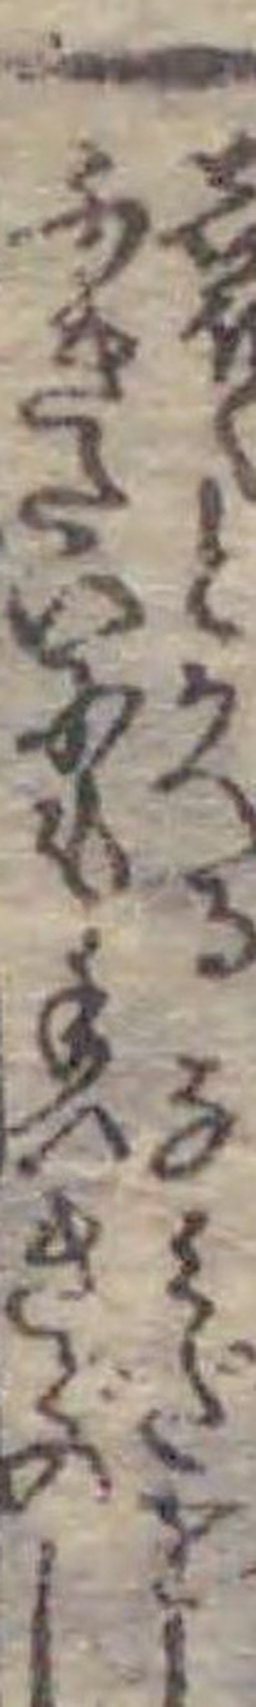ふきたいにもてはきどの
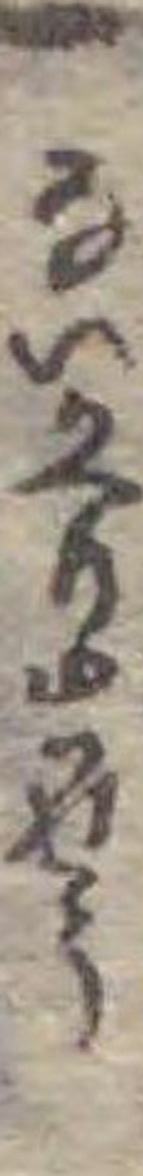ないかへりませう
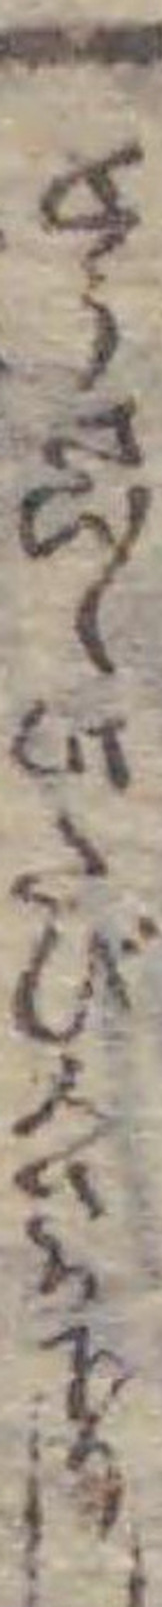とうさい〳〵此たび人さる下り
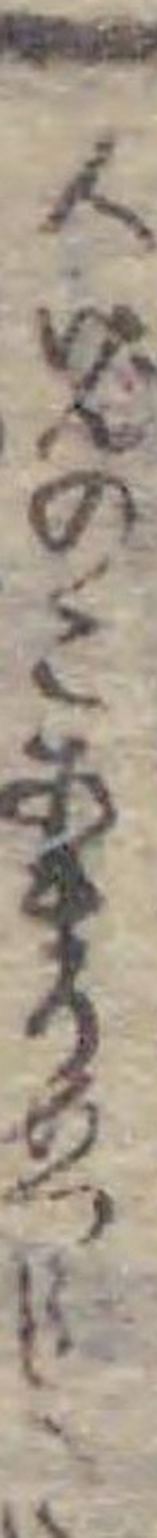人げんのこあまりめつらしき
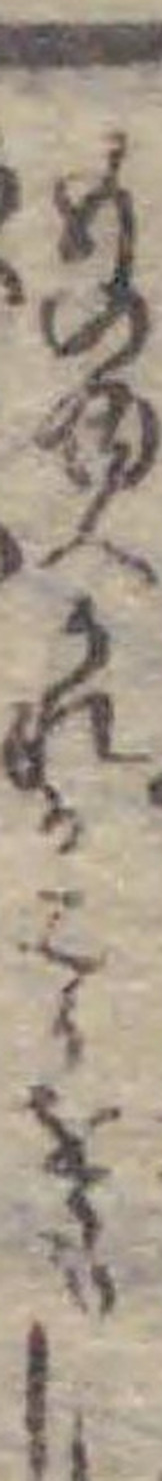ものゆへかれかこりを
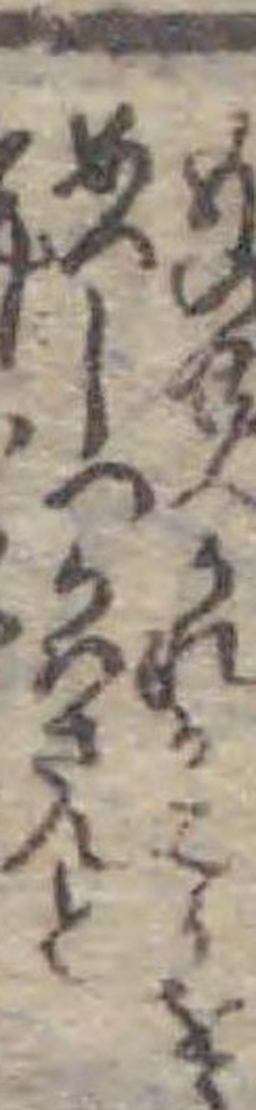めしつかはさんと
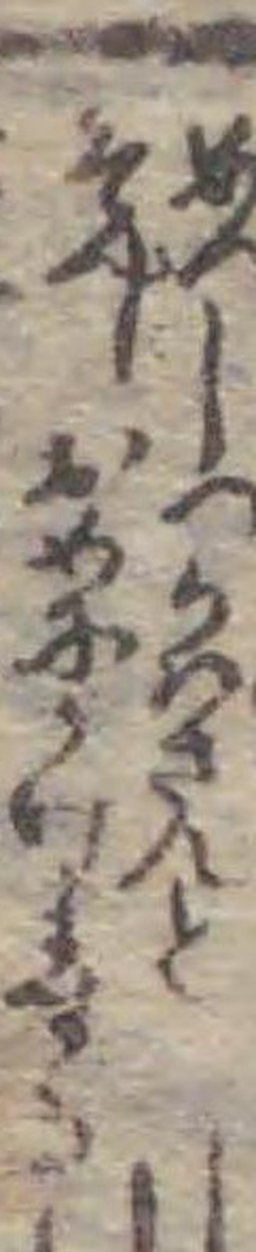そんしおめにかけまする
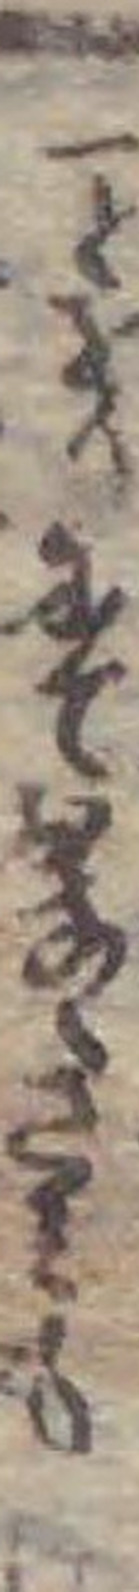一とをりにておなくさみも
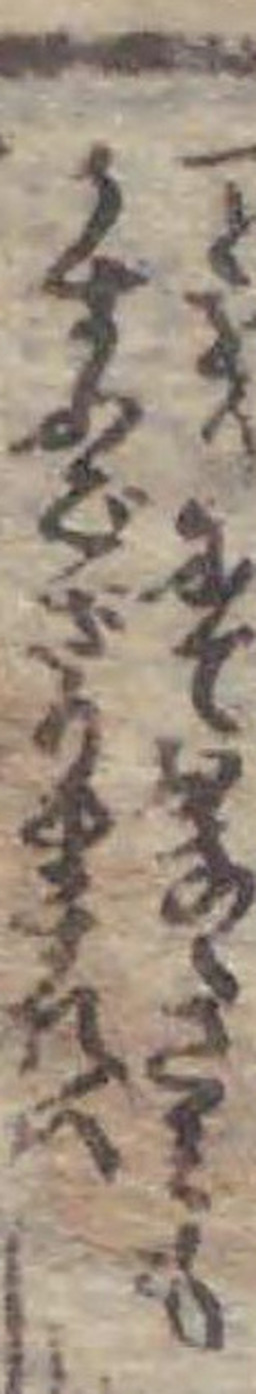うすふござりますれは
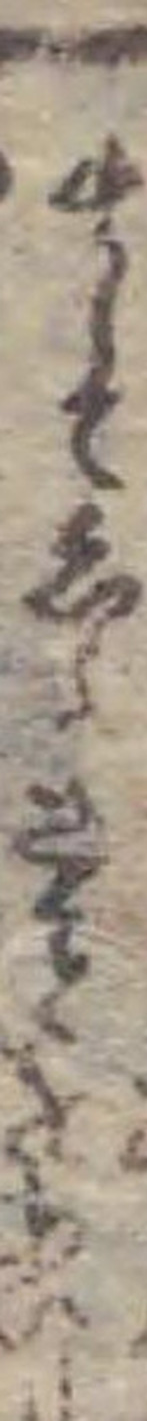ましてししよことをあい
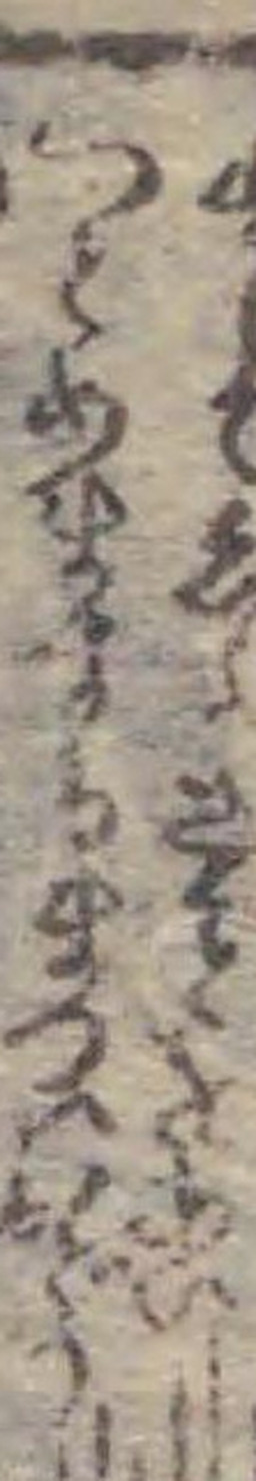つとめまするまつはおどり
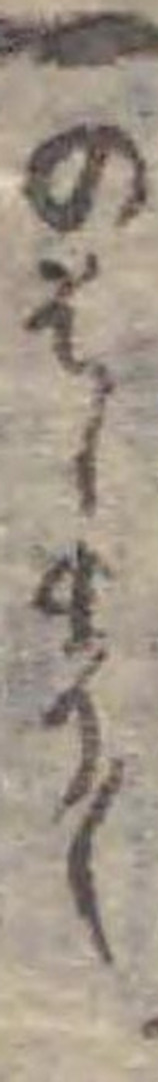のはしまり〳〵
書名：[化物一代記] : 5巻
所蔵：国立国会図書館 National Diet Library, JAPAN
